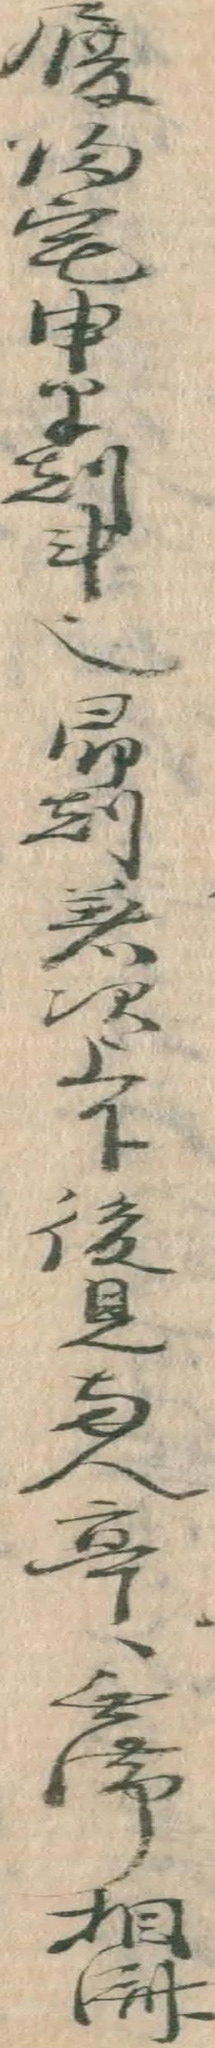履帰宅申半刻斗也即刻着次上下後見両人亭へ無滞相済
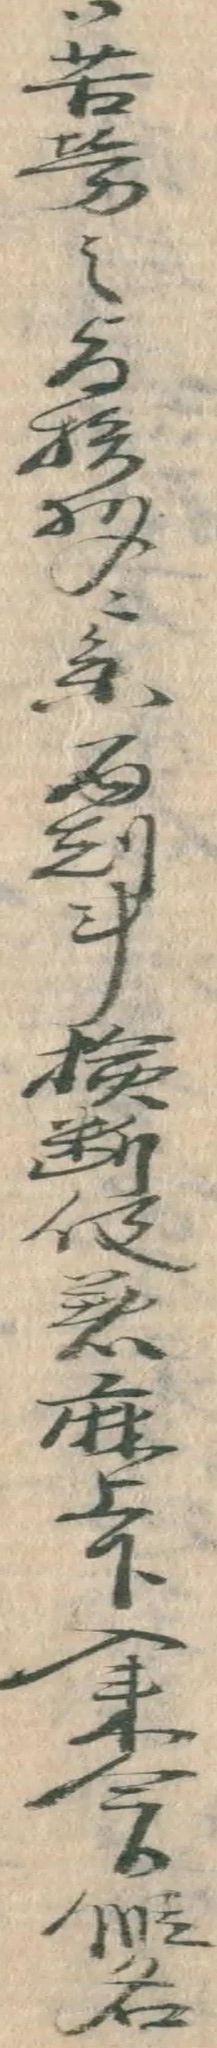御苦労之旨挨拶ニ参酉刻斗検断役着麻上下入来今日仮名
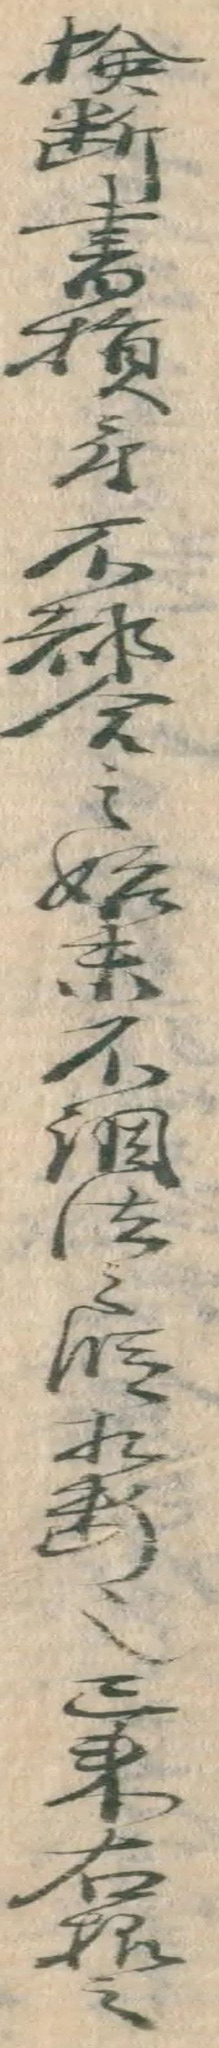検断書損ニ付不都合之始末不調法之段相断也巳来右様之
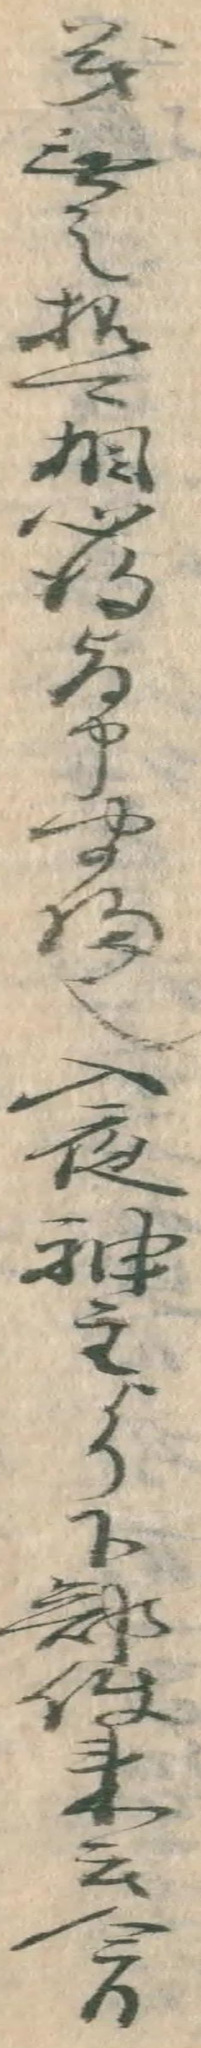義無之様可相心得旨申聞帰也入夜神主より下部使来云今日
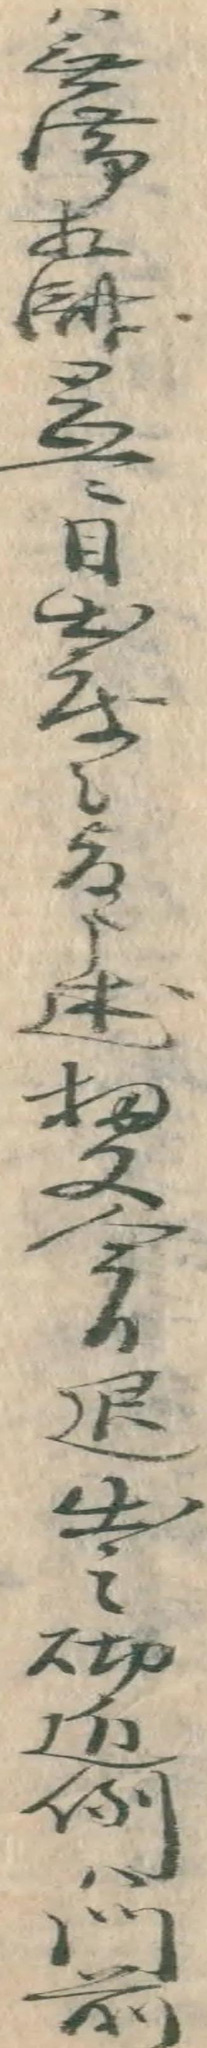ハ無滞相済御互ニ日出度之旨申述扨又今日退出之砌近例ハ門前
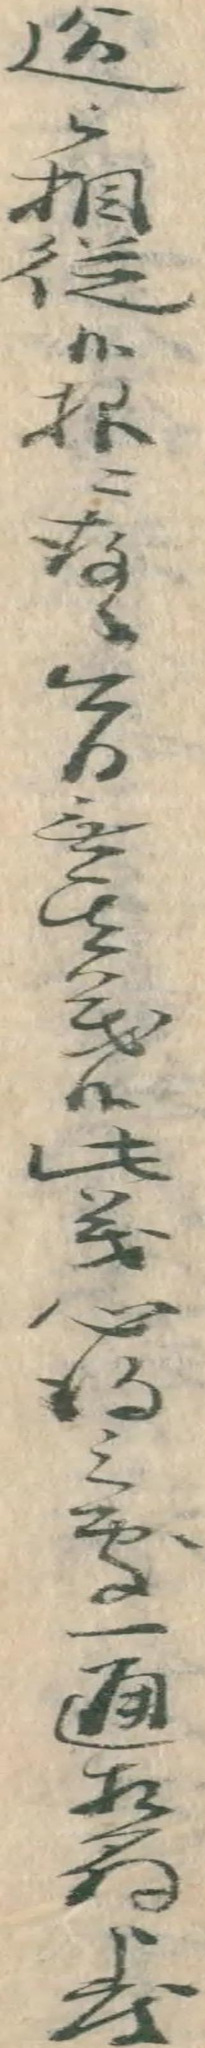迄被相従候様ニ存候今日無其義候此義心得之處一通相尋申度

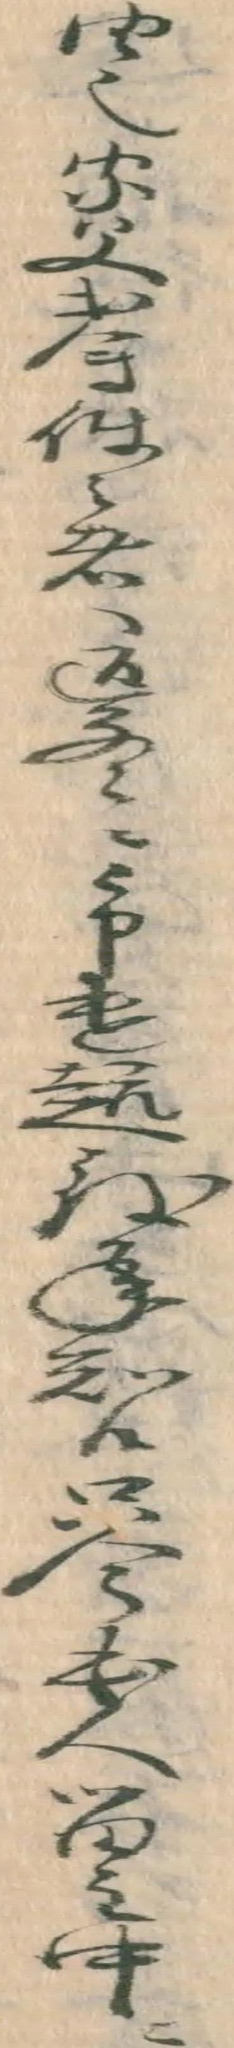由也家父出會使之者へ返答ニ被申遣趣致承知候只今両人留主中ニ
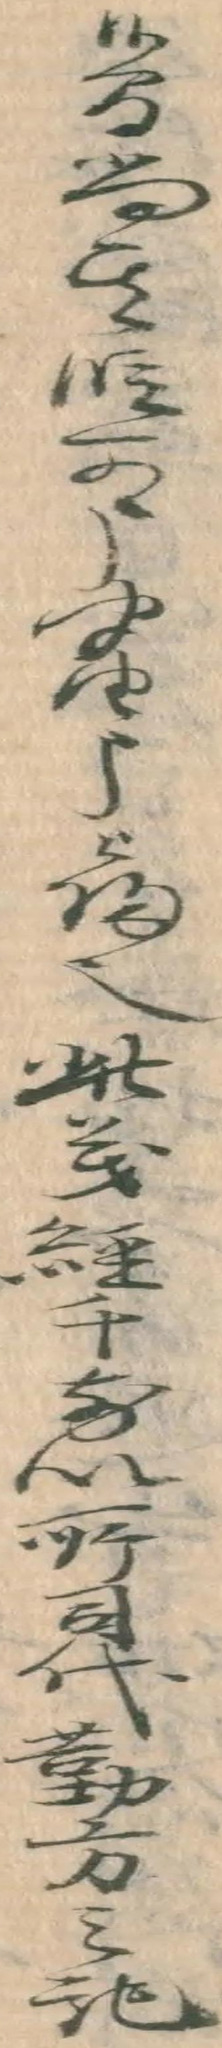候間尚其段可申聞由申被帰也此義経千奇以所司代勤方之記
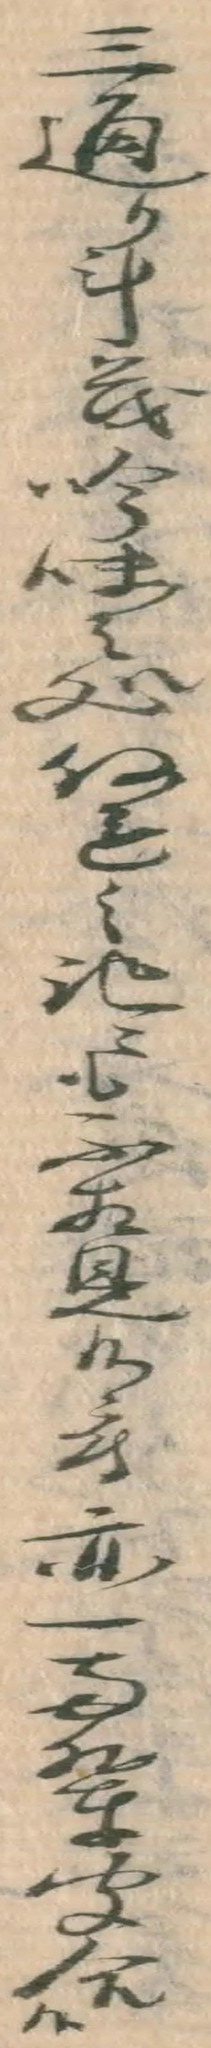三通り斗も吟味之処何れ之記ニも不相見候ニ付亦一両輩聞合候
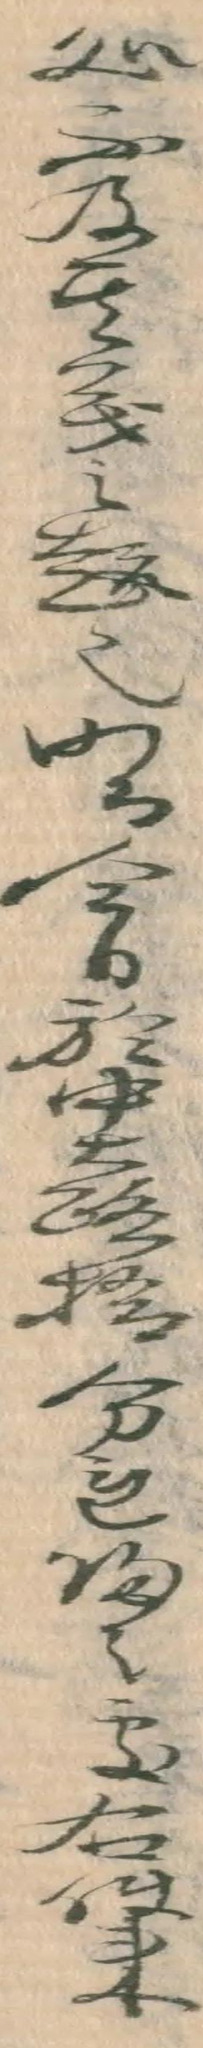処不及其義之趣也仍而今日於中大路橋分れ帰之處右使来
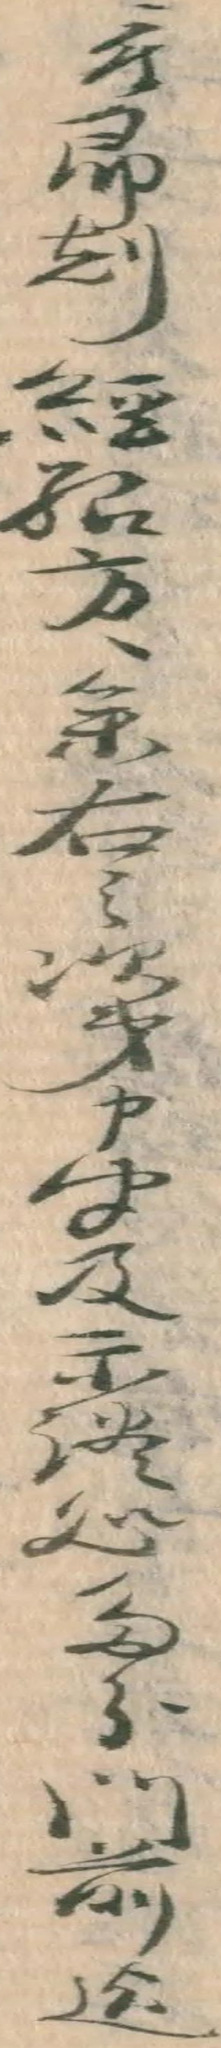ニ付即刻経招方へ参右之次第申聞及示談処多分門前迄
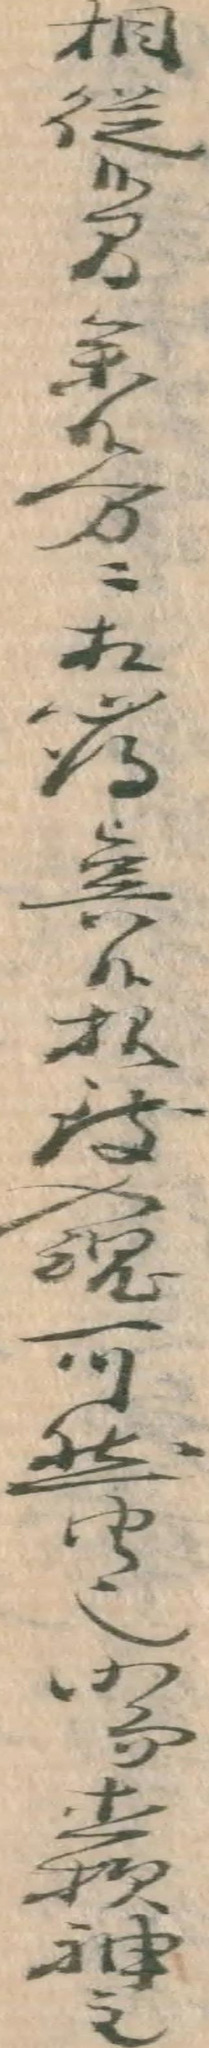相従候間参候分ニ相心得被呉候様致入魂可然由也仍而直様神主
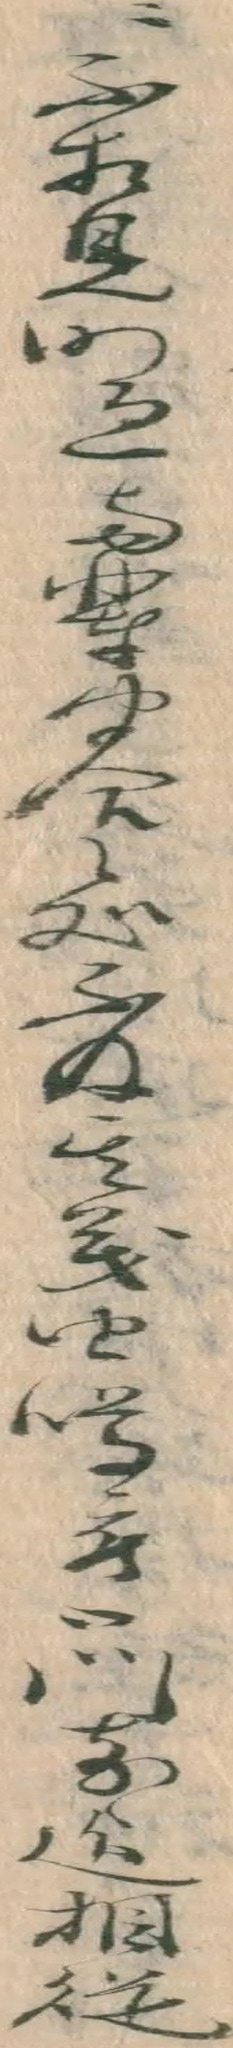ニ不相見仍而過両輩聞合候処不及其義由噂ニ付御門前迄相従
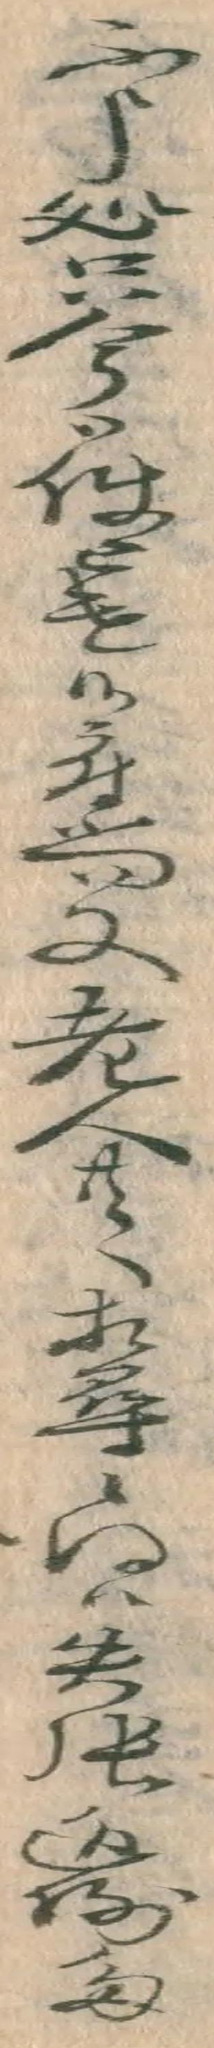不申処只今御使被遣候ニ付尚又老人共へ相尋候得ハ失張近例多
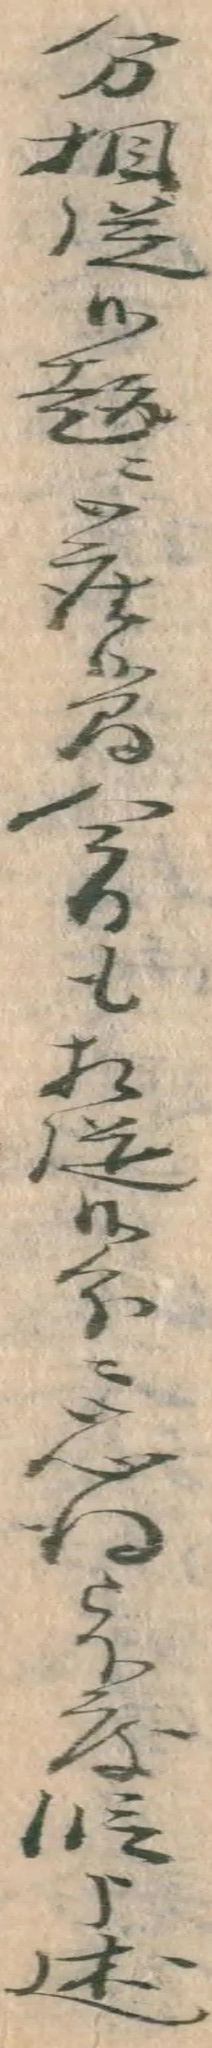分相従候趣に御座候間今日も相従候分に御心得被下度段申述
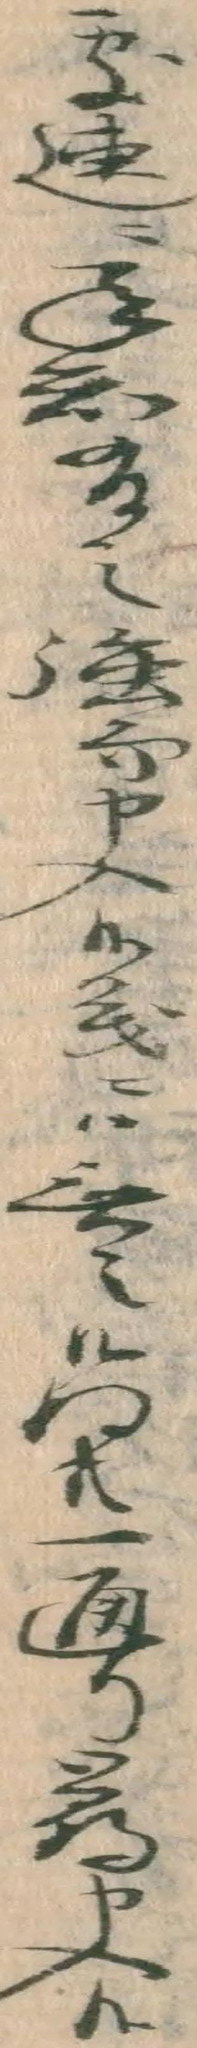處速二承知有之強而申入候義ニハ無之候得共一通り御尋申入候
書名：賀茂社記録. 第65冊
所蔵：国立国会図書館 National Diet Library, JAPAN
